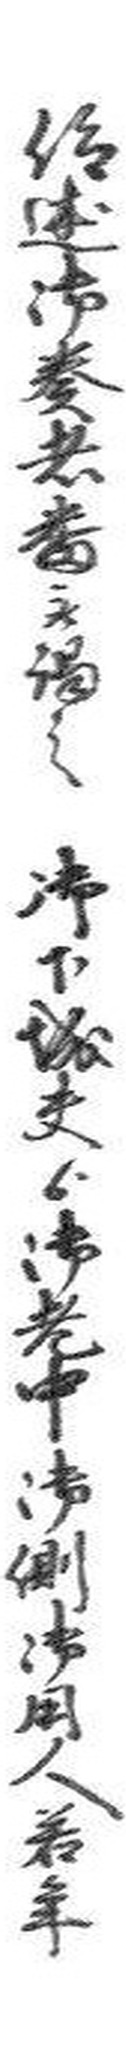仰述御奏者番被謁之御下城夫ゟ御老中御側御用人若年
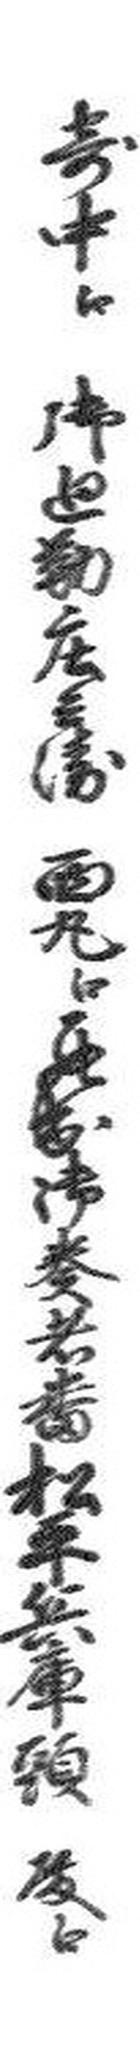寄中江御廻勤庄兵衛西丸江罷出御奏者番松平兵庫頭殿江
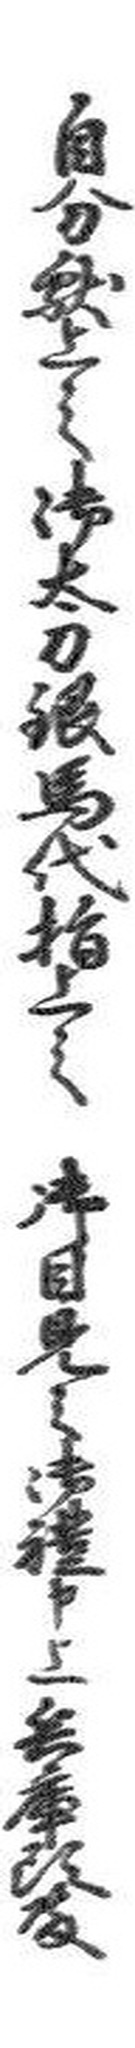自分献上之御太刀銀馬代指上之御目見之御礼申上兵庫頭殿
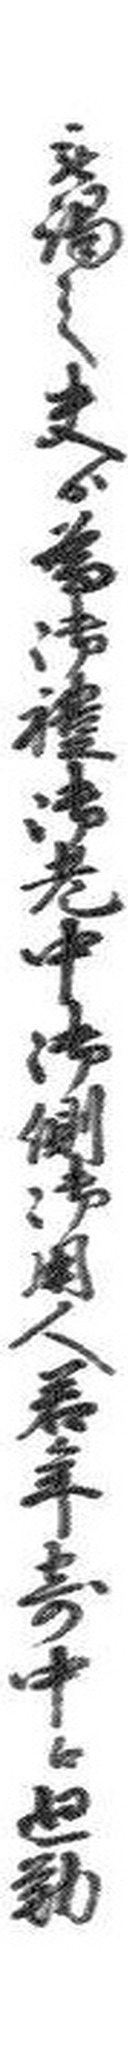被謁之夫ゟ為御礼御老中御側御用人若年寄中江廻勤
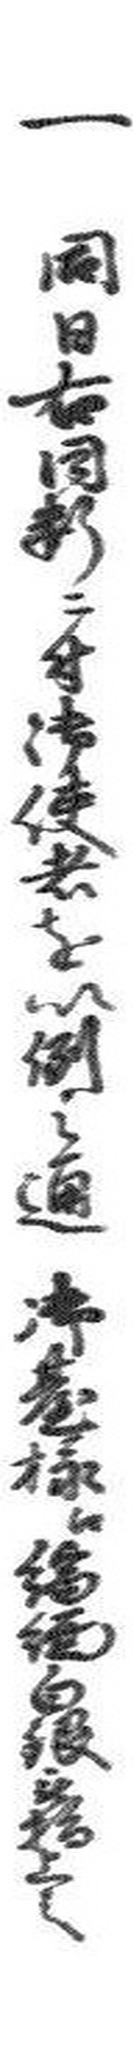一同日右同断ニ付御使者を以例之通御台様江縮緬白銀被指上之
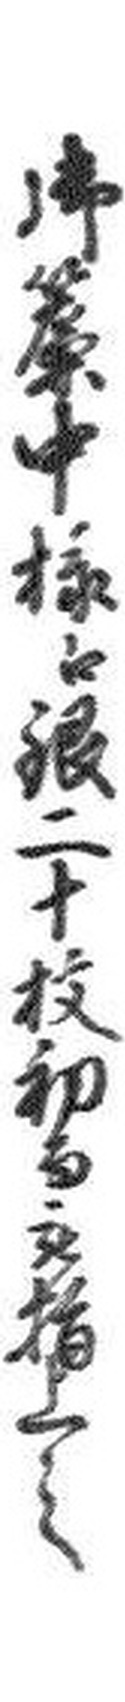御簾中様江銀二十枚初而被指上之
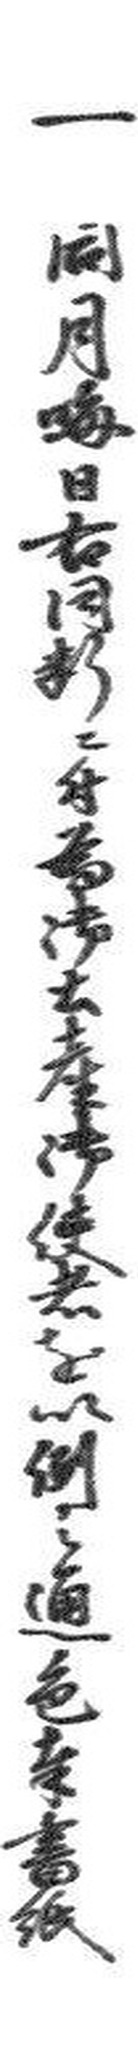一同月晦日右同断ニ付為御出産御使者を以例之通色奉書紙
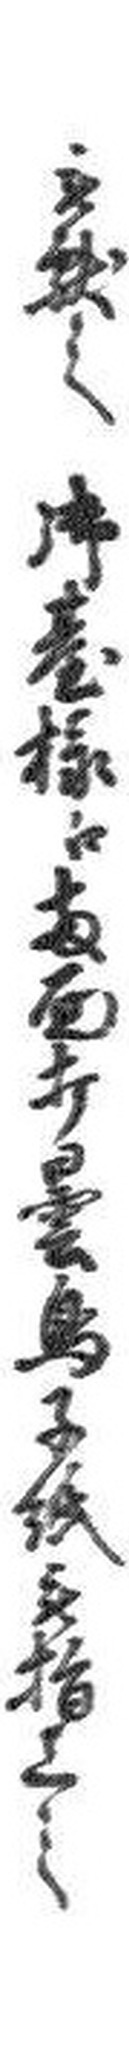被献之御台様江両面打曇鳥子紙被指上之
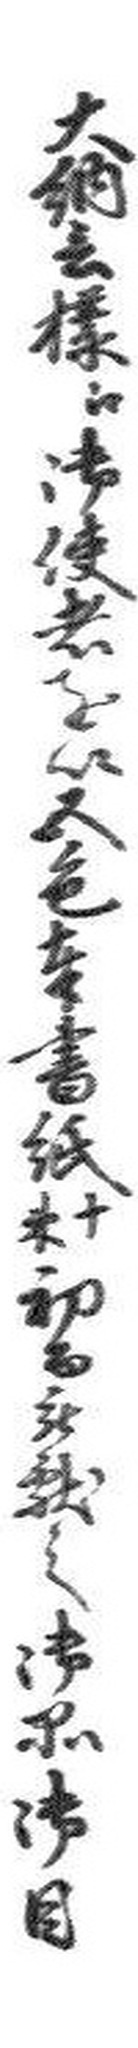大納言様江御使者を以五色奉書紙十束初而被献之御品御目
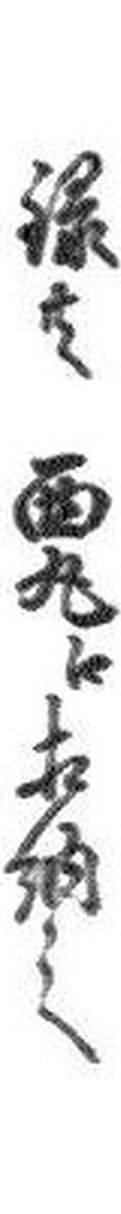録共西丸江相納之

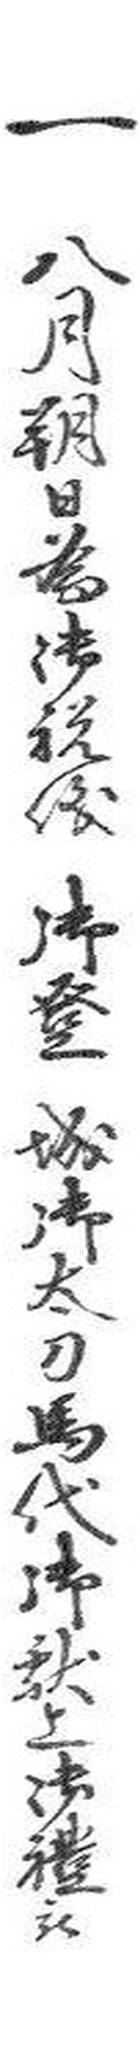一八月朔日為御祝儀御登城御太刀馬代御献上御礼被
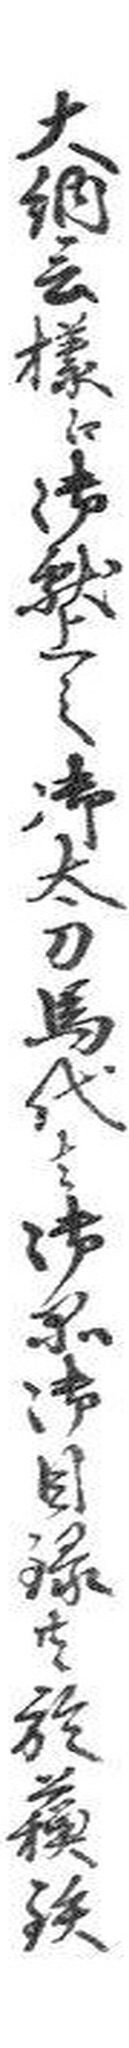大納言様江御献上之御太刀馬代之御品御目録共於蘓鉄
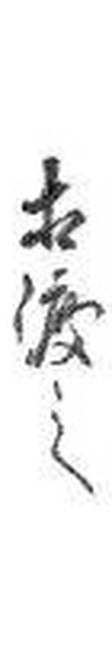相渡之
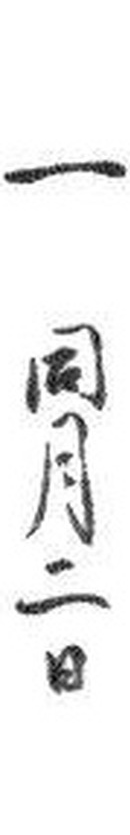一同月二日
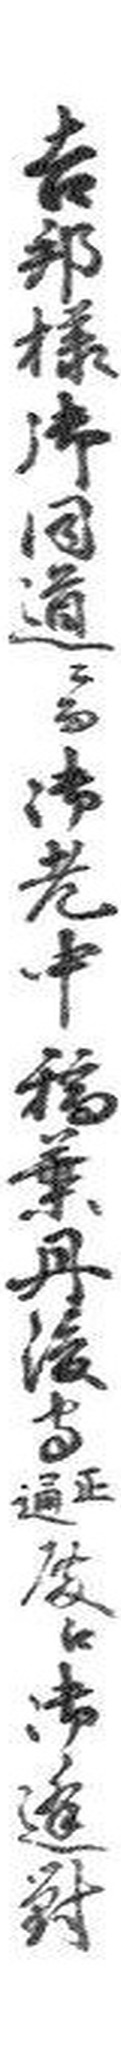吉邦様御同道ニ而御老中稲葉丹後守正通殿江御逢対
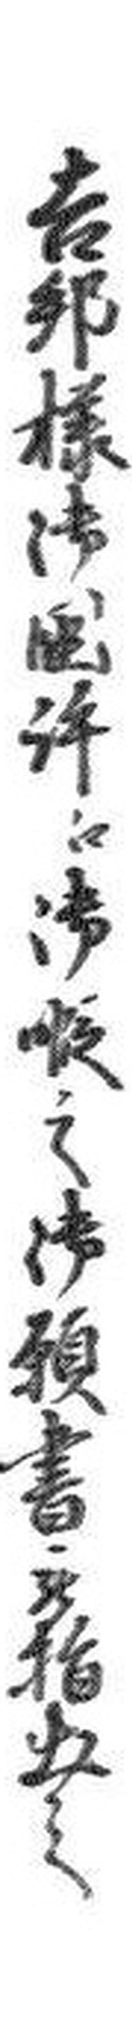吉邦様御国許江御暇之御願書被指出之
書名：家譜 二十四 吉品公 従宝永三年到同五年
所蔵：福井県文書館 Fukui Prefectural Archives
